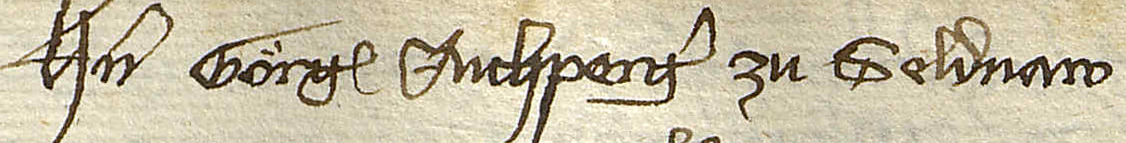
Hn Görg* Aichperg* ʒu Seldnaw
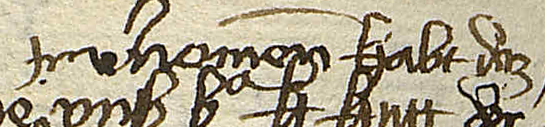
Ir v*nom*en habt daʒ
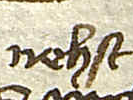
nehſt
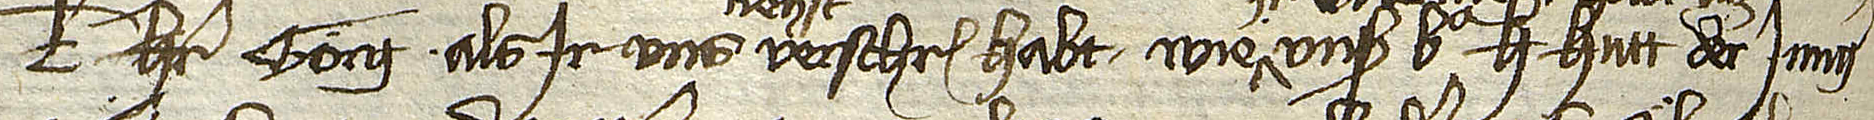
L* hr* Görg . als Ir vns verſchr* habt / wie vnſ* b* h* hutt der Iung*
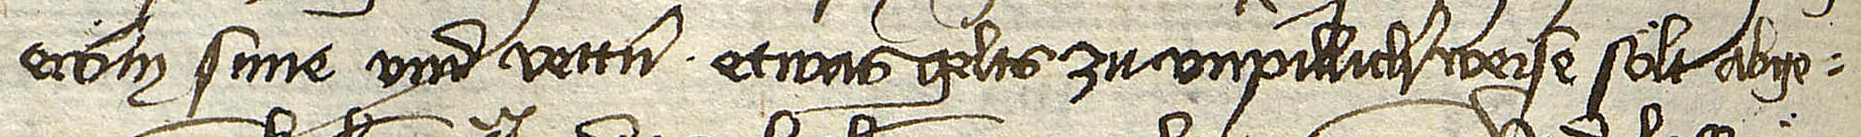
ewm* ſune vnd vettn* . etwas gelts ʒu vnpillich* weiſe ſölt abge =
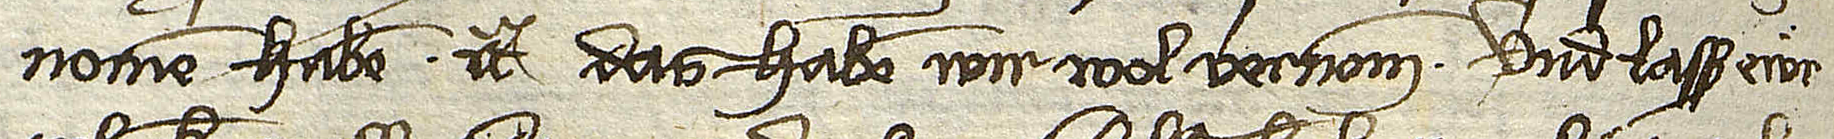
nome* habe* . ec* das habe* wir wol vernom* . Vnd laſſ* ewr
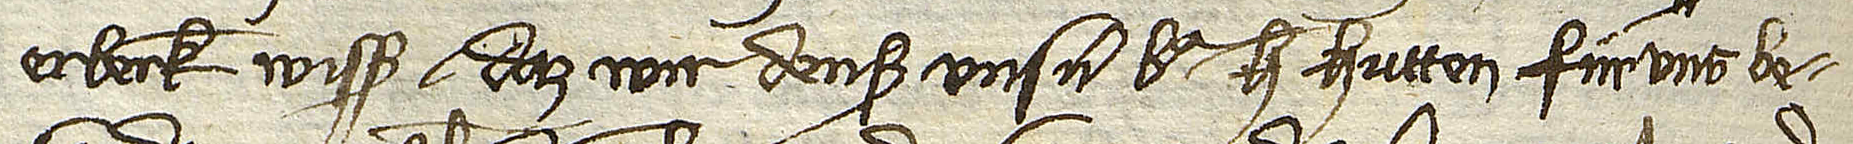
erberk* wiſſ* / daʒ wir denſ* vnſn* b* h* hutten für vns be =
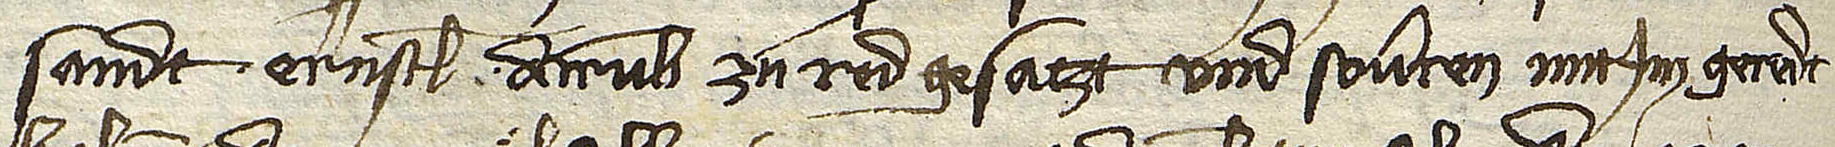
ſandt . ernſtl* . darub* ʒu rede geſacʒt vnd ſouren* mit Im geredt
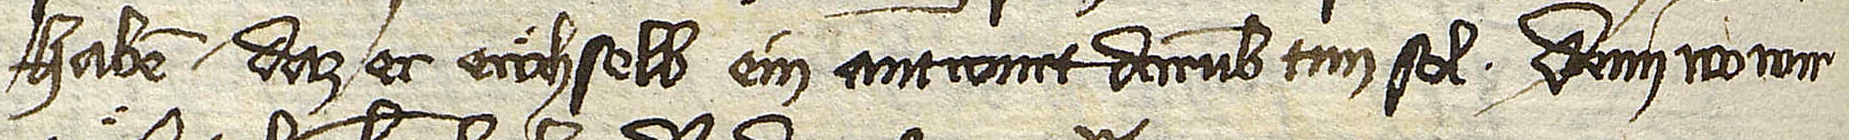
habe* / daʒ er ewch ſelb ein antwurt darub* tun ſol . Denn wo wir
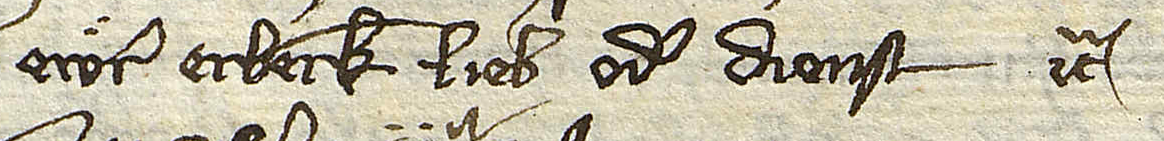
ewr* erberk* lieb od* dienſt ec*
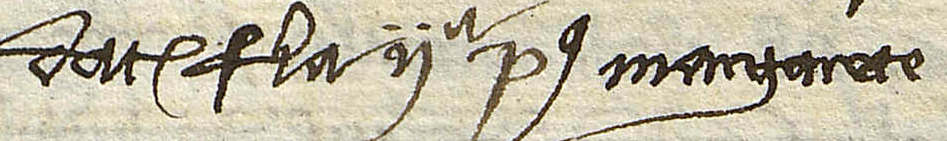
Dat* fia* ii* p* margarete
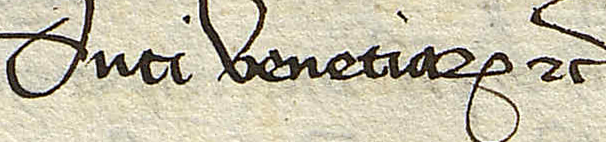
Duci Venetia* ec*
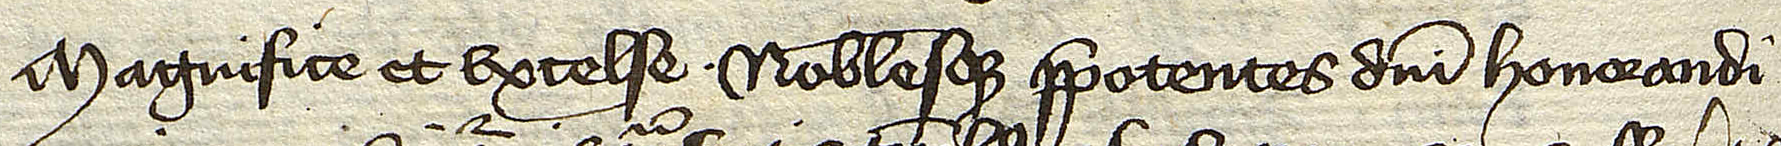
Magnifice et Excelſe . Nobileſq* p*potentes d*ni honorandi
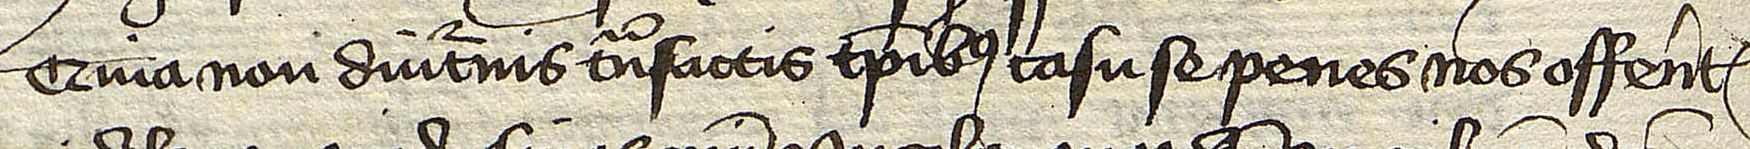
Quia non diut*nis t*nſactis t*p*ib* caſu ſe penes nos offe*nt*
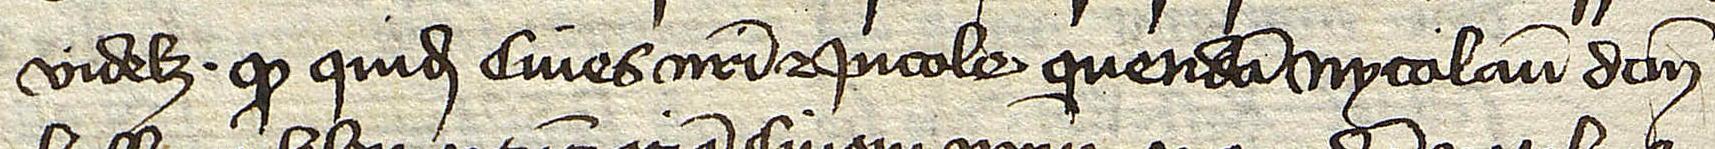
videl* . q* quid* Ciues n*ri @ Incole quenda* Nycolau* di*um
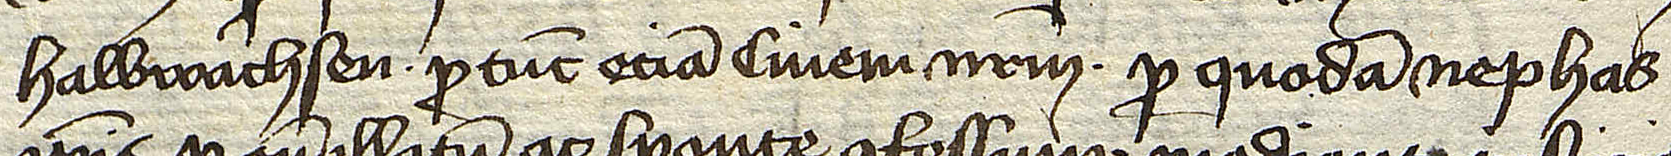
Halbwachſen . p*tu*c etia* Ciuem n*r*m . p* quoda* nephas
